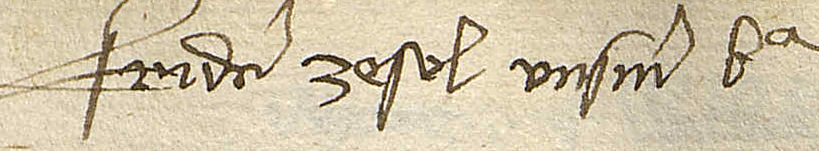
Fridr* ʒeſel vnſm* b*
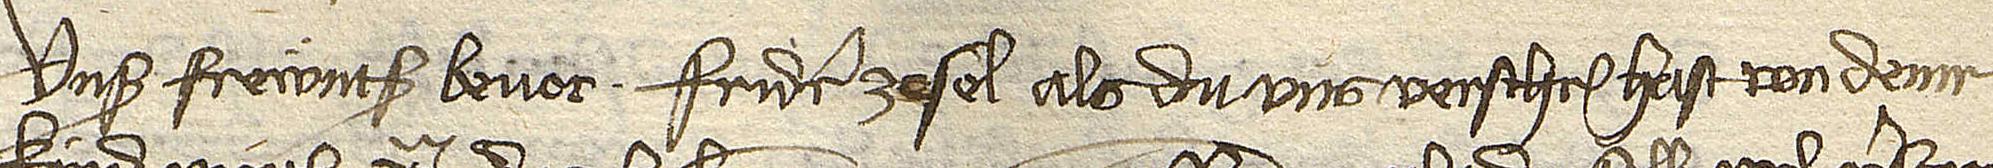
Vnſ* frewntſ* beuor . Fridr* ʒeſel als du vns verſchr* haſt von deinr
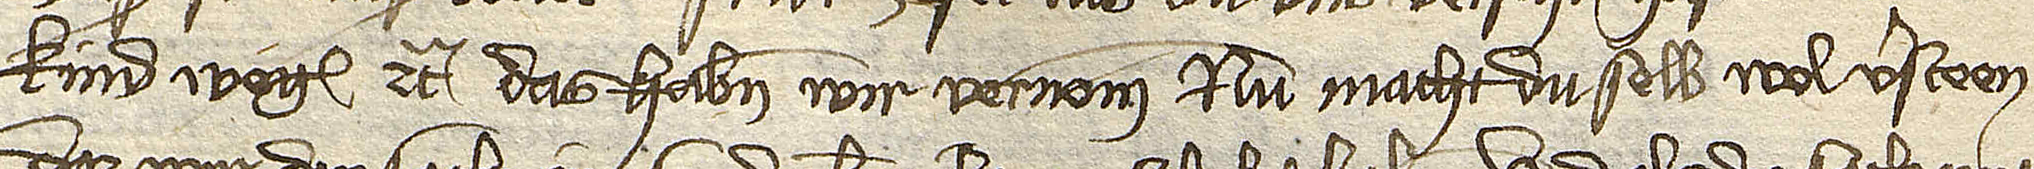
kind weg* ec* das habn* wir vernom* Nu macht du ſelb wol v*ſteen
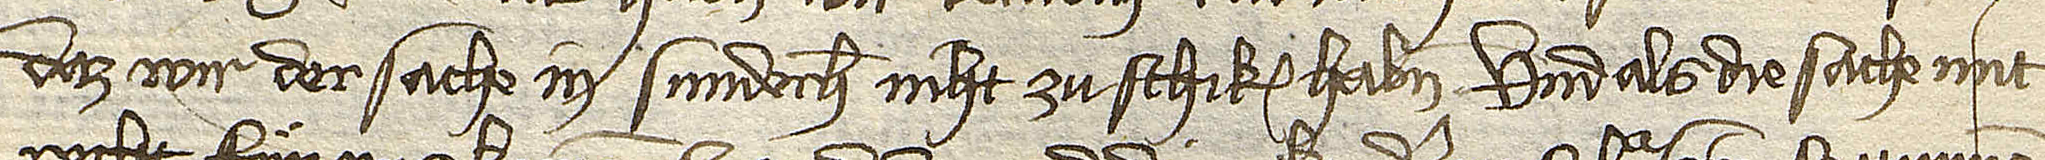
daʒ wir der ſache in ſunderh* niht ʒu ſchik* habn* Vnd als die ſache mit
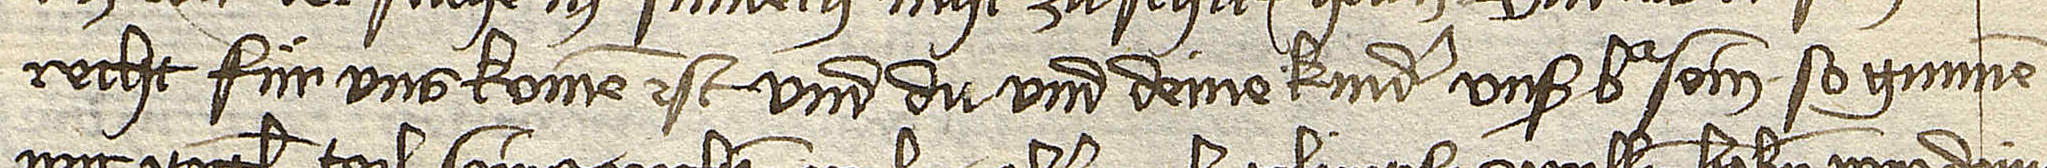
recht für vns kome* iſt vnd du vnd deine kind* vnſ* b* ſein . ſo gunne*
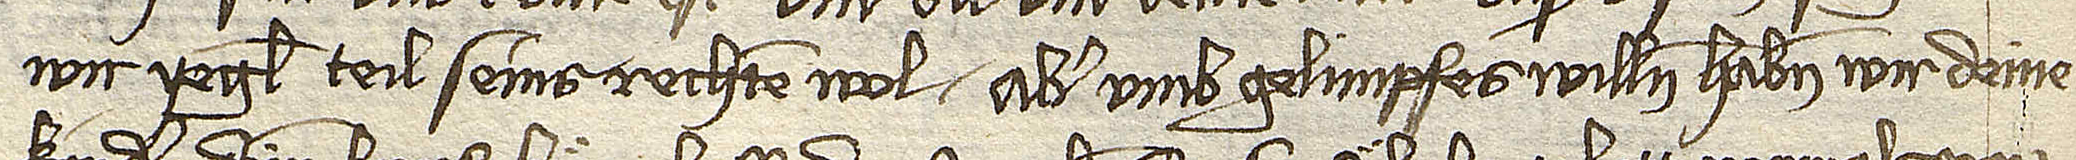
wir yegl* teil ſeins rechte* wol / ab* vmb gelimpfes willn* habn* wir deine
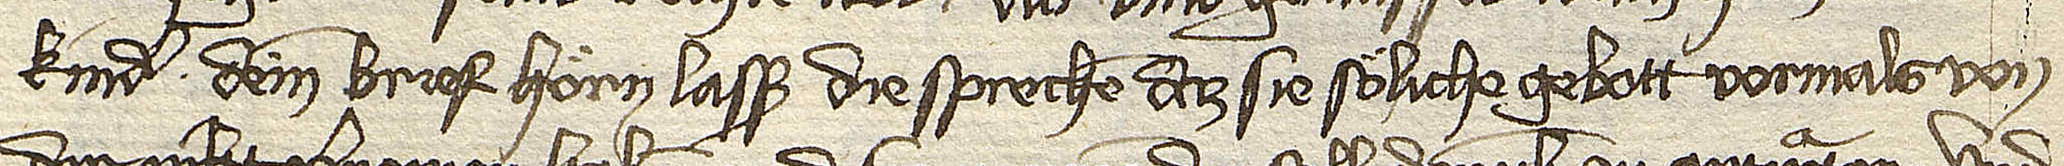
kind* . dein* brief hörn laſſ* die ſpreche* daʒ ſie ſöliche gebott vormals von
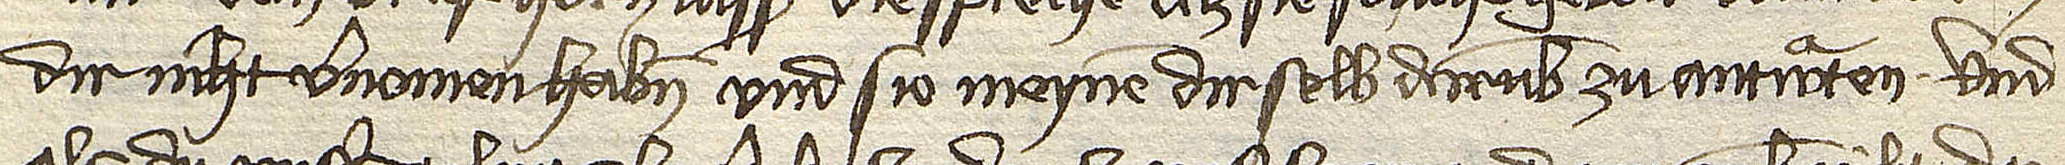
dir niht v*nomen habn* vnd ſie meyne* dir ſelb darub* ʒu antw*ten . Vnd
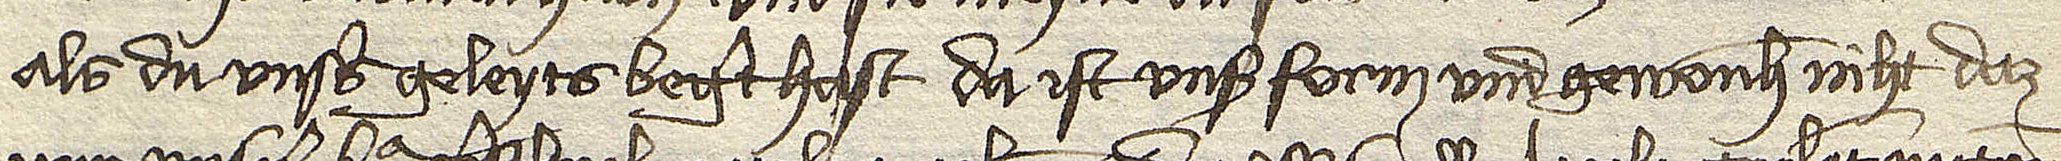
als du vnſs* geleyts beg*t haſt da iſt vnſ* form vnd gewonh* niht daʒ
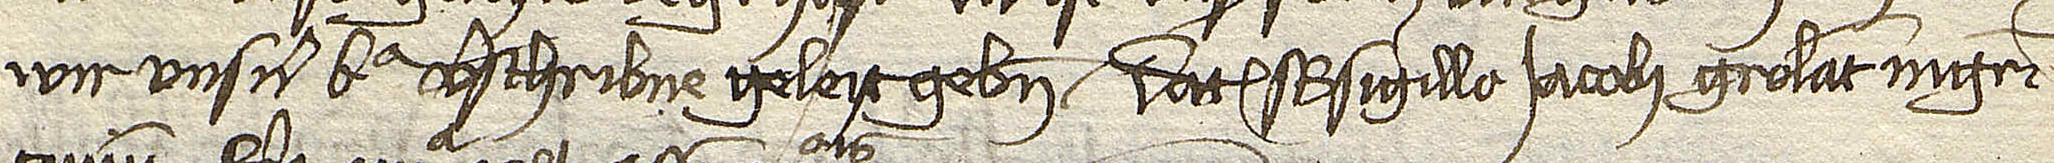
wir vnſn* b* v*ſchribne geleyt gebn* / Dat* ſBſigillo Iacobi grolat* mgri*
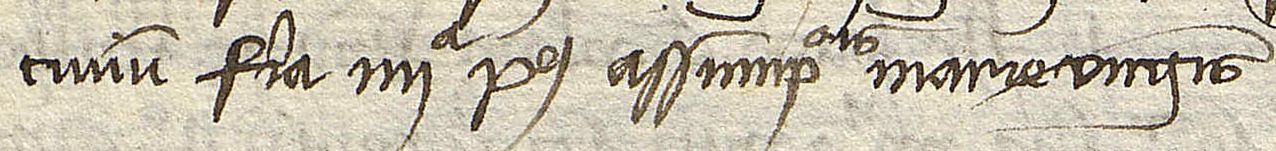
ciuiu* fi*a iiii* p* aſſump* marie virgis*
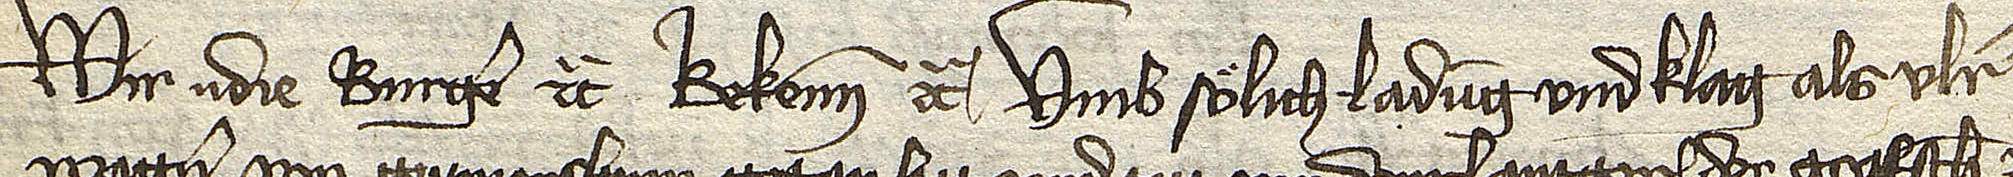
Wir ~ die Burge* ec* Bekenn* ec* Vmb ſölich ladug* vnd klag als vlr*
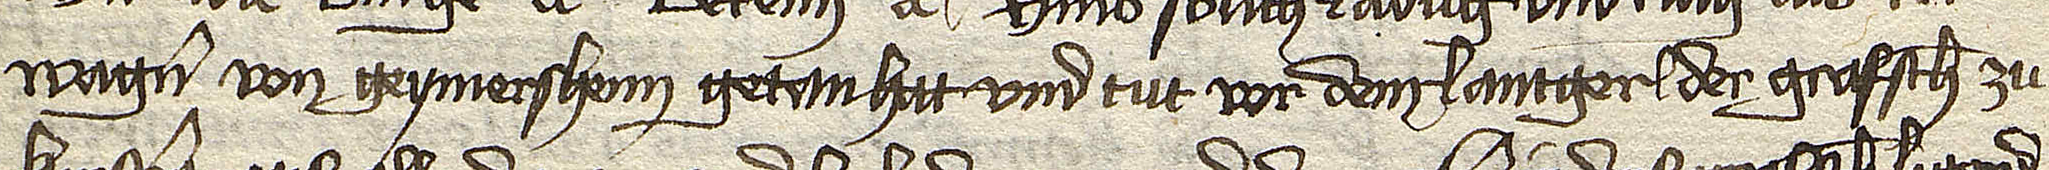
wagn* von geymerſheim getan hat vnd tut vor dem lantger* der grafſch* ʒu
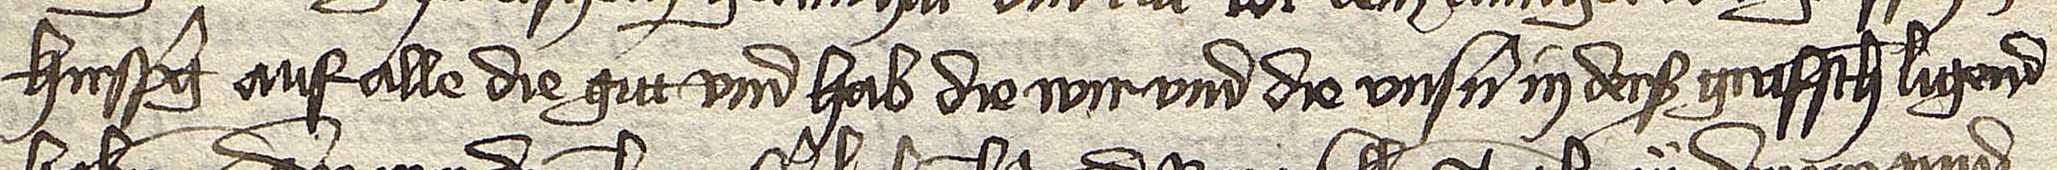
hirſpg* auf alle die gut vnd hab die wir vnd die vnſn* in derſ* grafſch* ligend
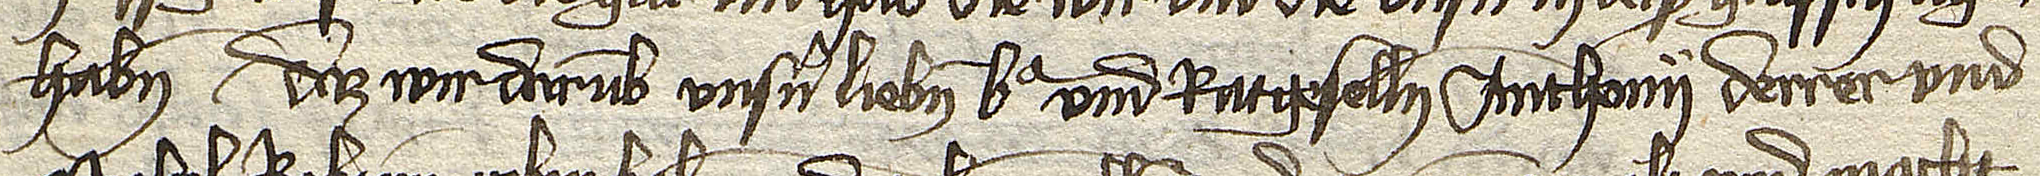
habn* / Daʒ wir darub* vnſn* liebn* b* vnd Ratgeſelln* Anthonii Derrer vnd
